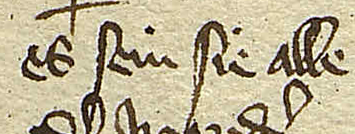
es ſein ſie alle
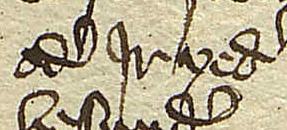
od* Ir yed*
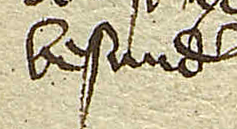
beſund*
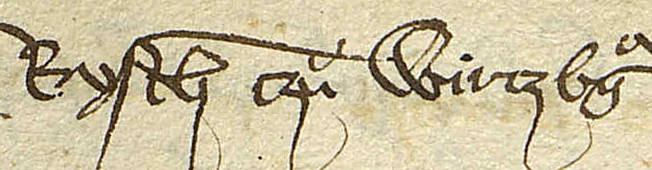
Byſch* cʒü Wircʒb*g
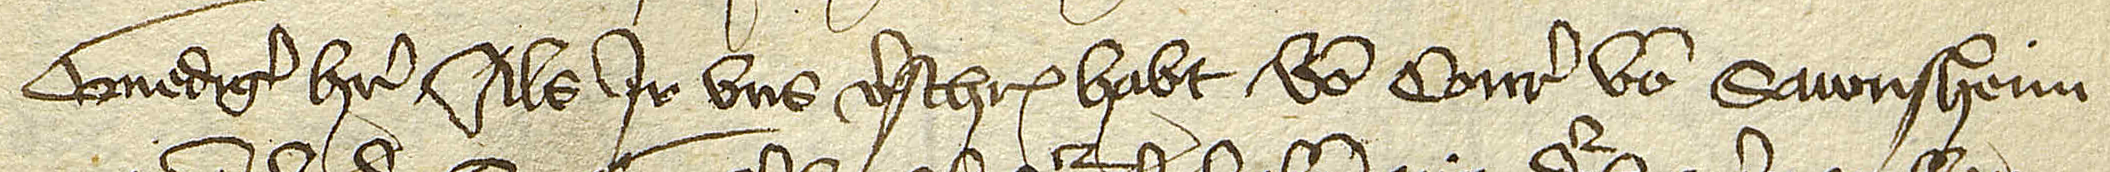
Gnedig* hr* / Als Ir vns v*ſchr* habt / vo* Conr* vo* Sawnſheim
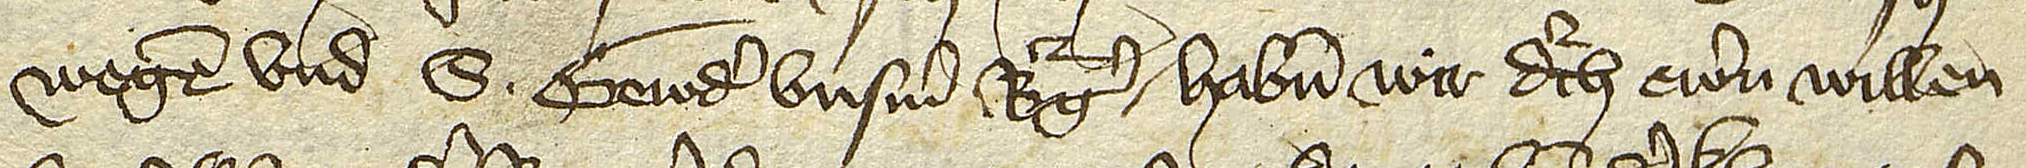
wege* vnd S . Gewd* vnſm* B*g* / habn* wir d*ch ew*n willen
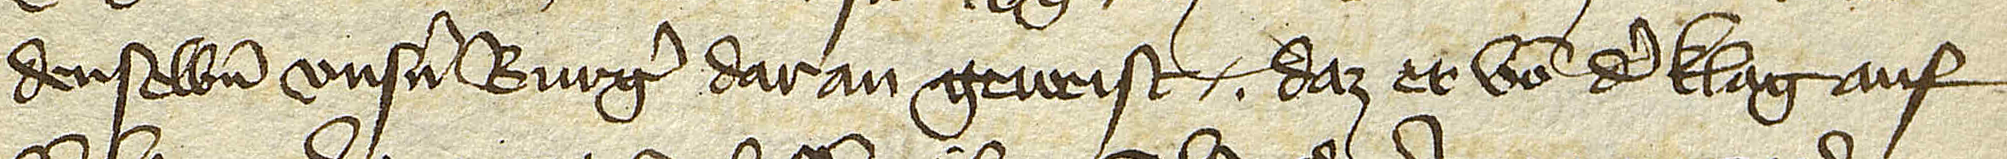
denſelbn* vnſn* Burg* daran geweiſt / . daʒ er vo* d* klag auf
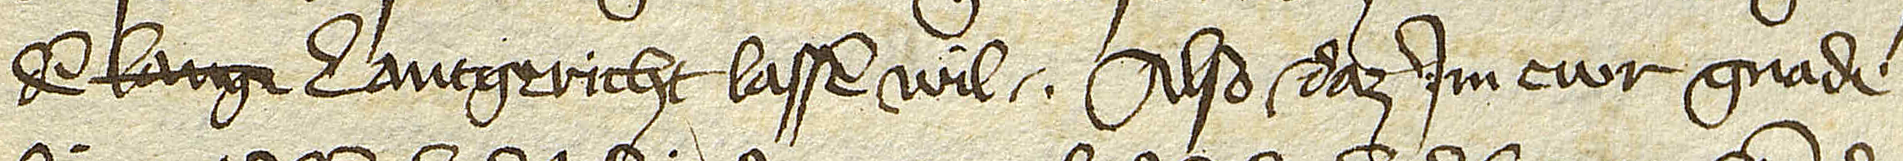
d* lange Lantgericht laſſe* wil / . Alſo / daʒ Im ewr gnade
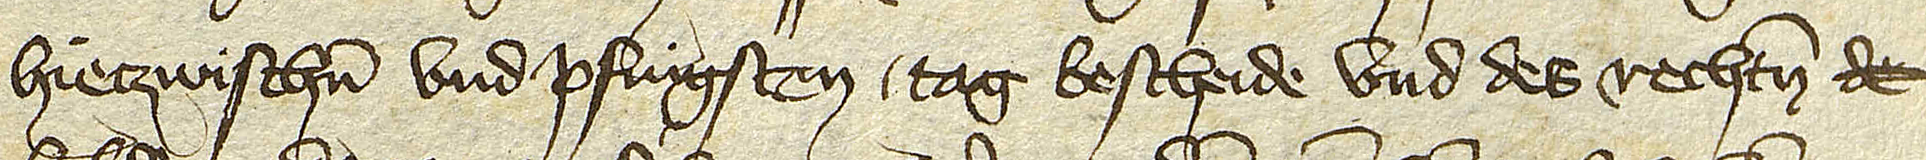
hiecʒwiſchn* vnd pfingſten / tag beſcheide vnd des rechtn* de
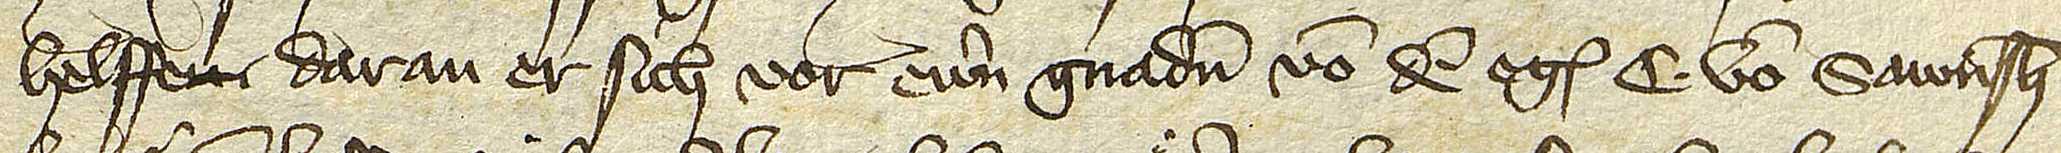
helffen / daran er ſich vor ew*n gnadn* vo* d* eg* C . vo* Sawnſh*
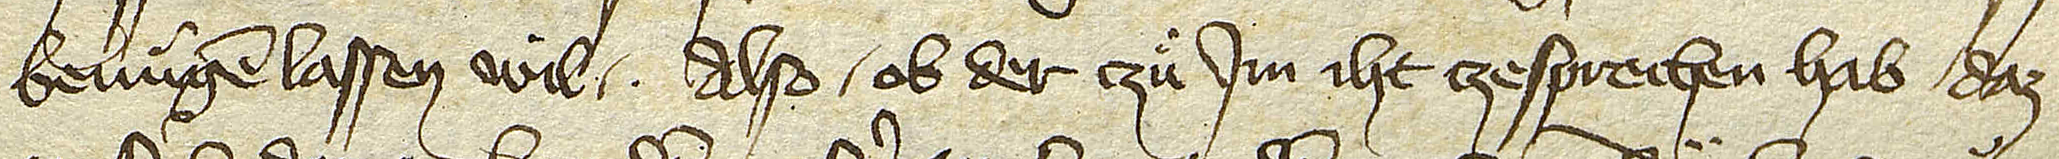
benüge* laſſen wil / . Alſo / ob der cʒü Im iht cʒeſprechen hab / daʒ
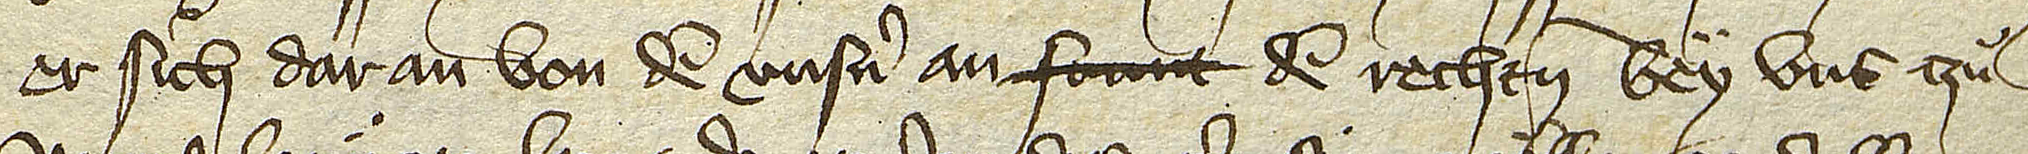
er ſich daran von d* vnſn* an frunt de* rechtn* bey vns cʒü
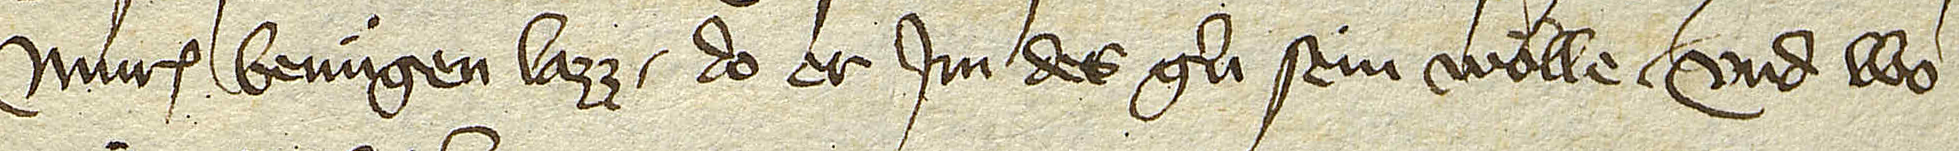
Nur* benügen laʒʒ / do er Im des g*n ſein wölle / vnd wo
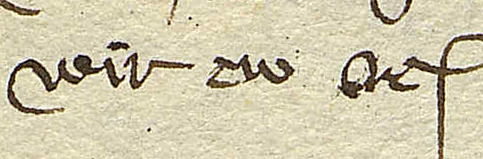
wir ew ec*
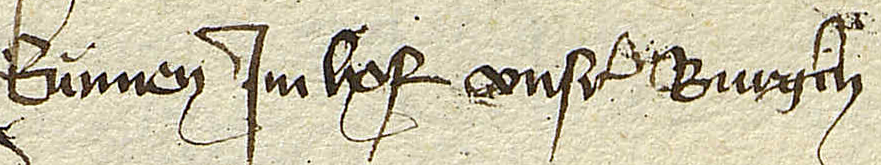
Künnen Imhof vnſr* Burg*in
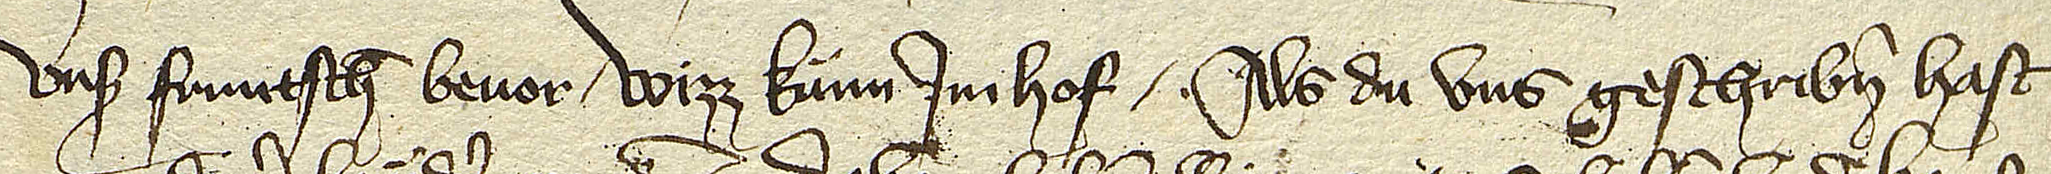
Vnſ* fruntſch* beuor / Wiʒʒ künn Imhof / . Als du vns geſchribn* haſt
